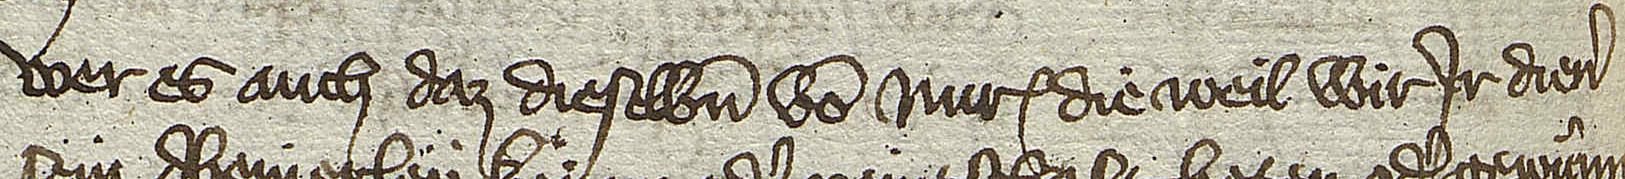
Wer es auch daʒ dieſelbn* vo* Nur* die weil wie Ir dien*
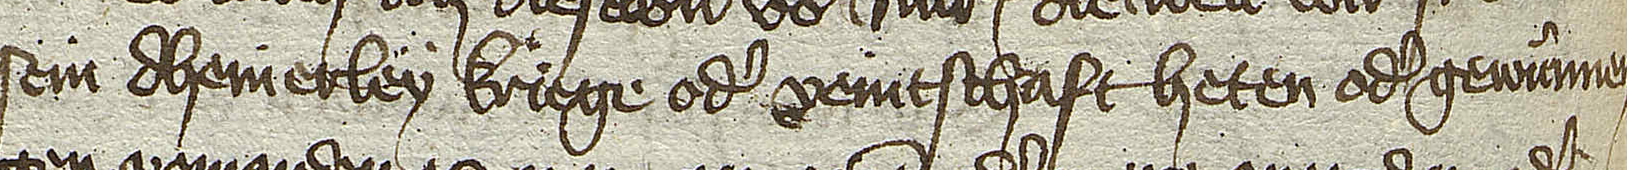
ſein dheinerley kriege od* veintſchaft heten od* gewünnen
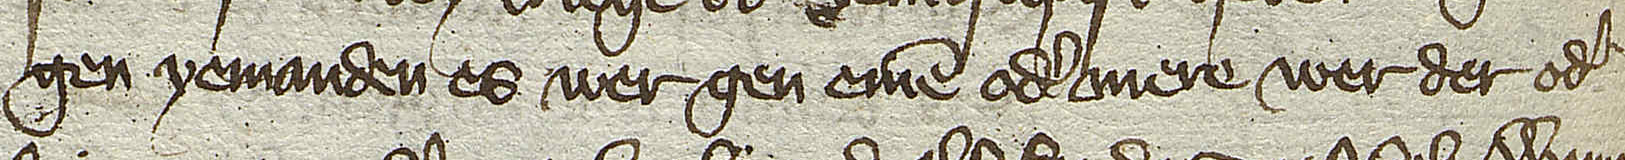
gen yemanden es wer gen eine* od* mere wer der od*
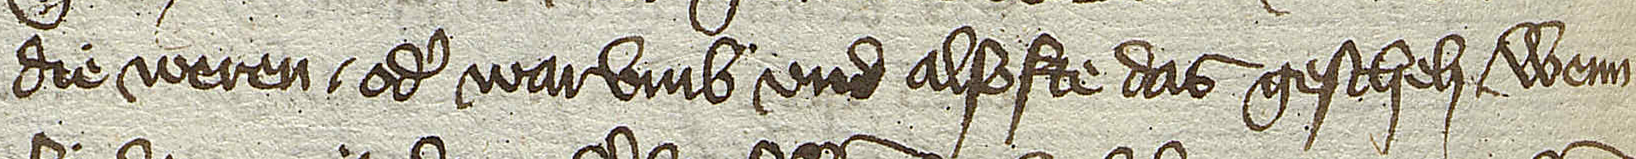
die weren / od* warvmb vnd alſofte das geſcheh / Wenn
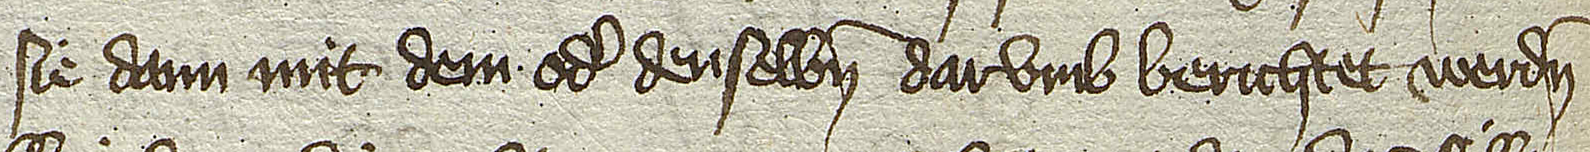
ſie dann mit dem od* denſelbn* darvmb berichtet werdn*
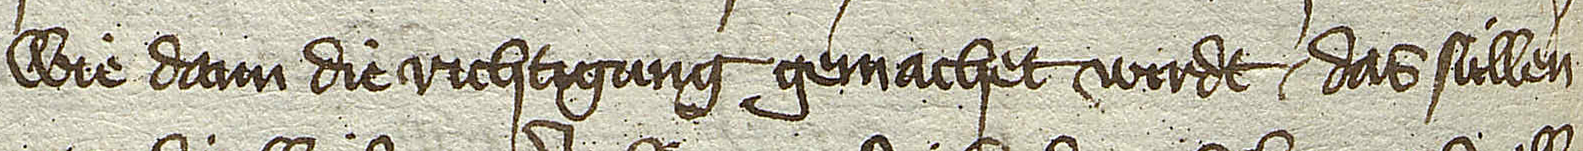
wie dann die richtigung gemachet wirdt / das ſüllen
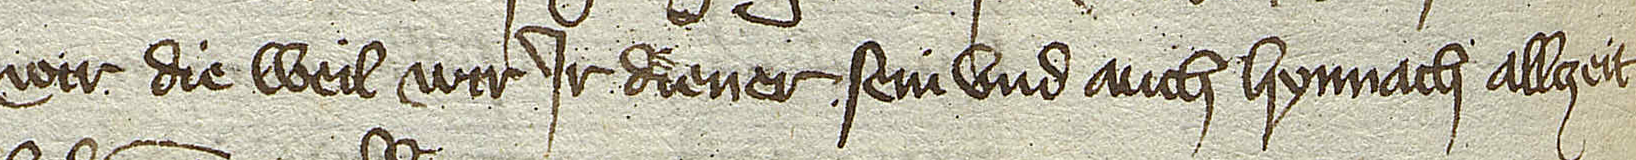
wir die weil wir Ir diener ſein vnd auch hynnach allcʒeit
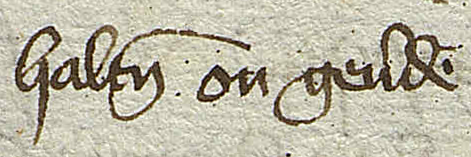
haltn* on geu*de
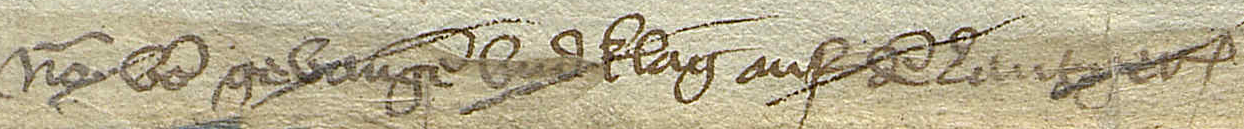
No* vo* gevange* vnd klag auf d* Lantger*
